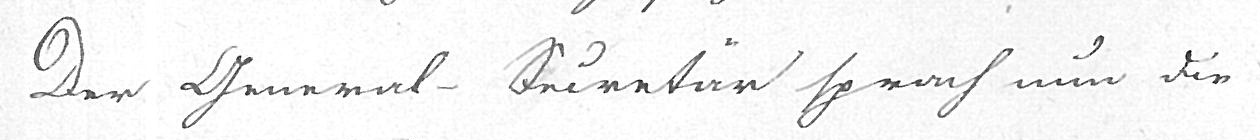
Der General-Secretär sprach nun die
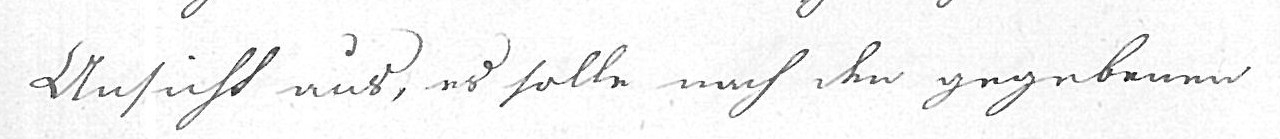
Ansicht aus, es solle nach den gegebenen
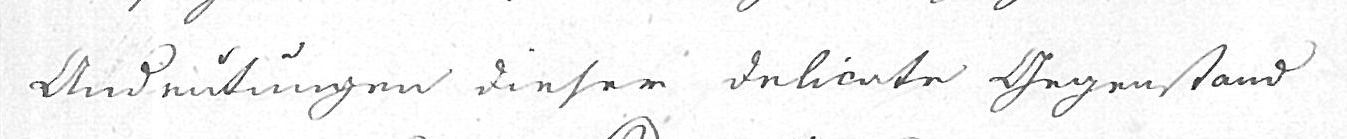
Andeutungen dieser delicate Gegenstand
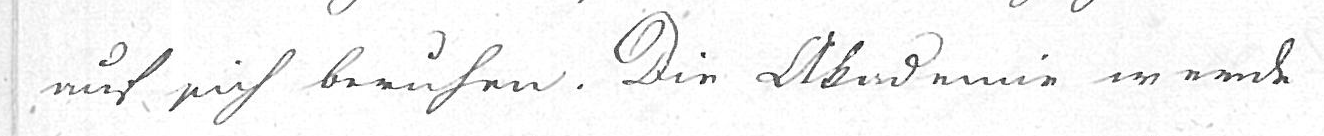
auf sich beruhen. Die Akademie werde
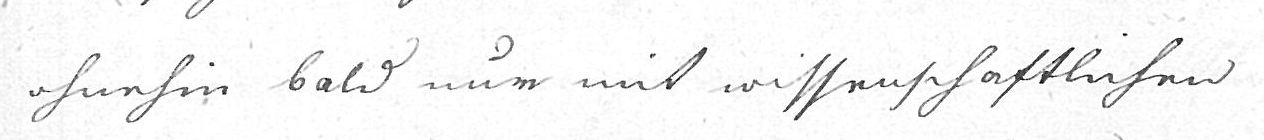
ohnehin bald nur mit wissenschaftlichen
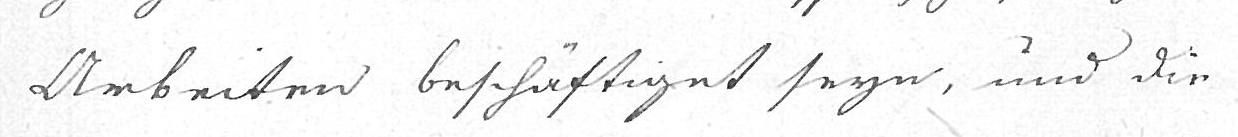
Arbeiten beschäftiget seyn, und die
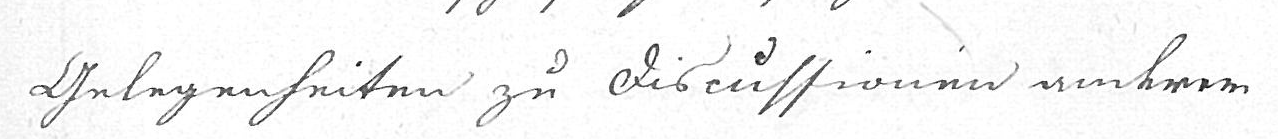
Gelegenheiten zu Discussionen anderer
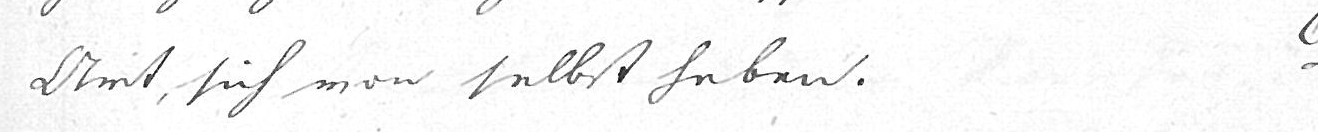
Art, sich von selbst heben.
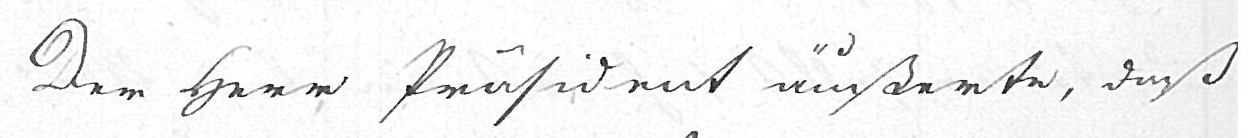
Der Herr Präsident äußerte, daß
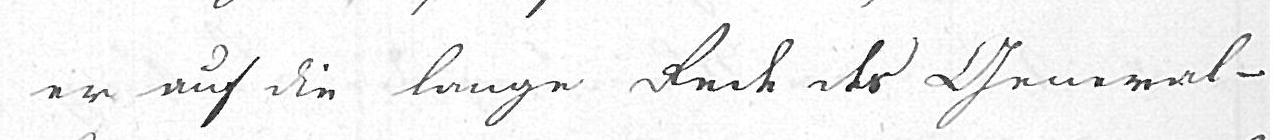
er auf die lange Rede des General-
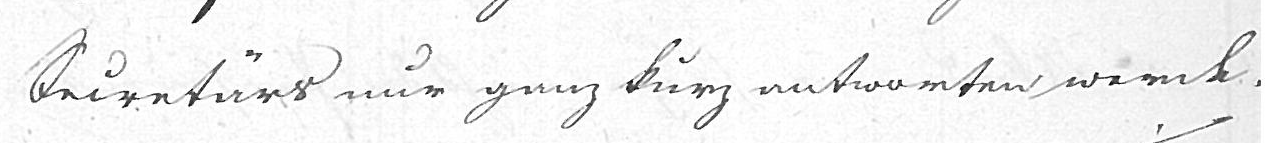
Secretärs nur ganz kurz antworten werde.
